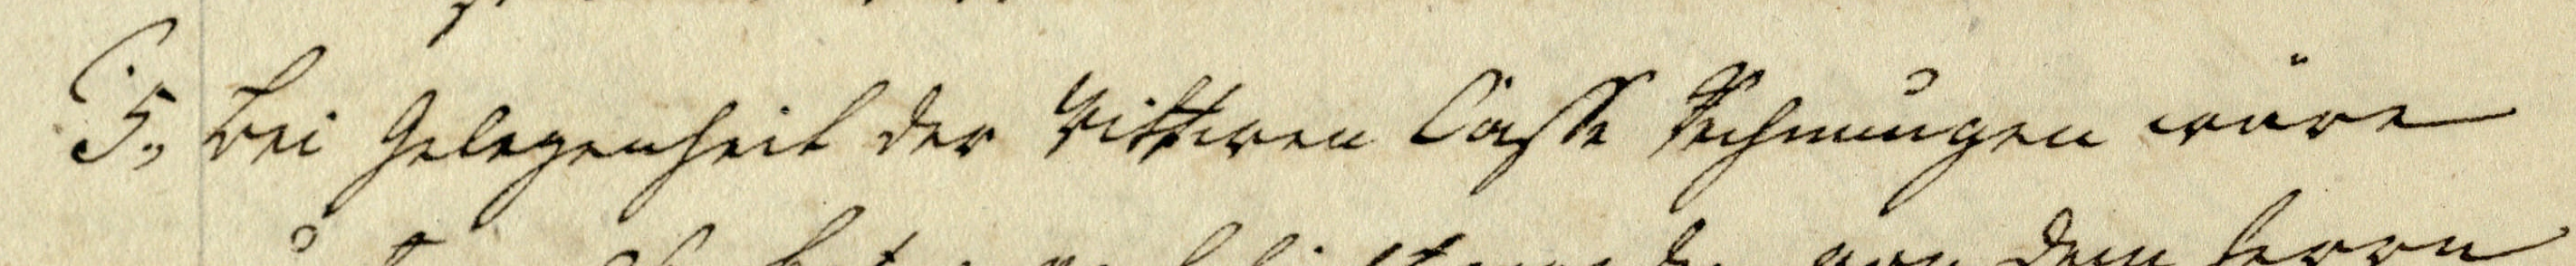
5., Bei Gelegenheit der Wittwen Casse Rechnungen wäre
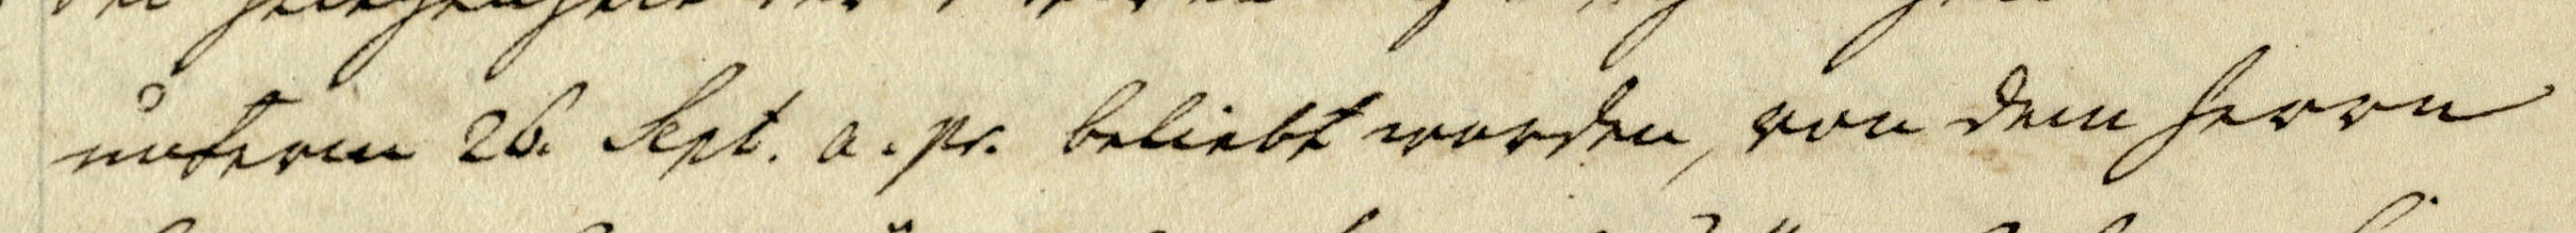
unterm 26. Sept. a. pr. beliebt worden, von dem Herrn
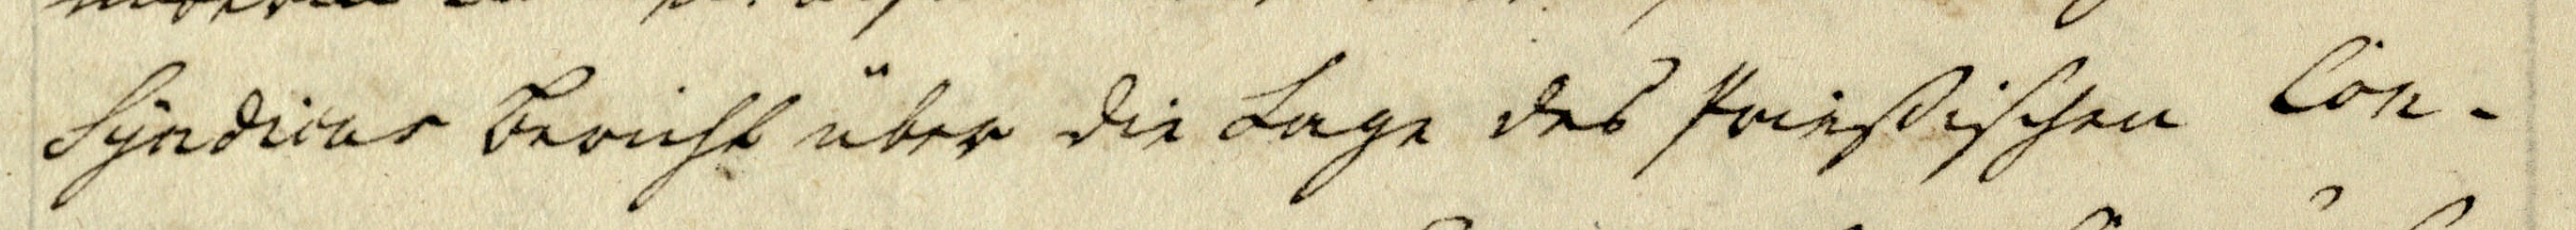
Sÿndicus Bericht über die Lage des Prießischen Con¬
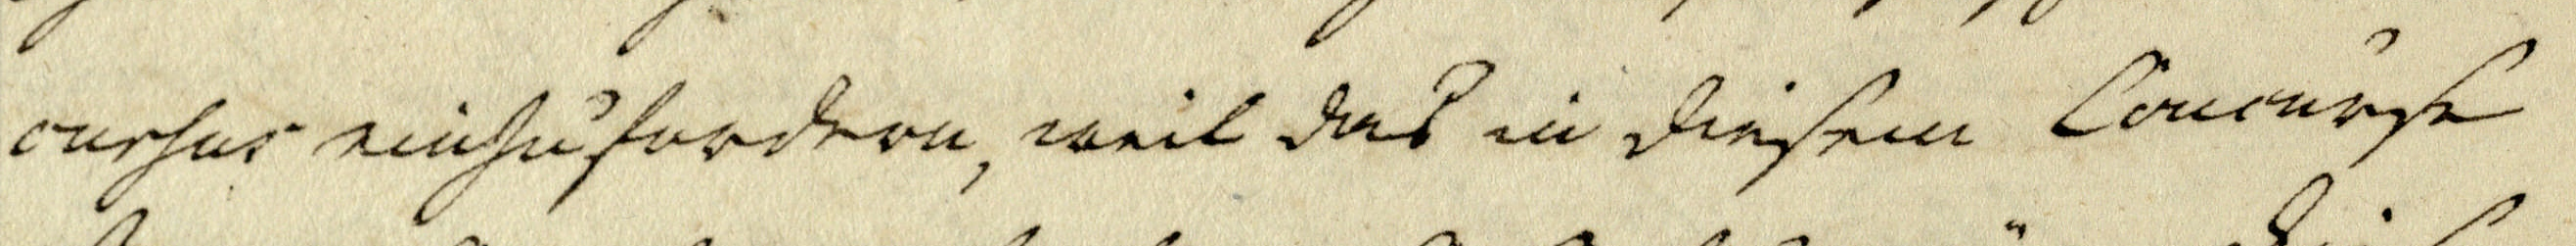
cursus einzufordern, weil das in diesem Concurse
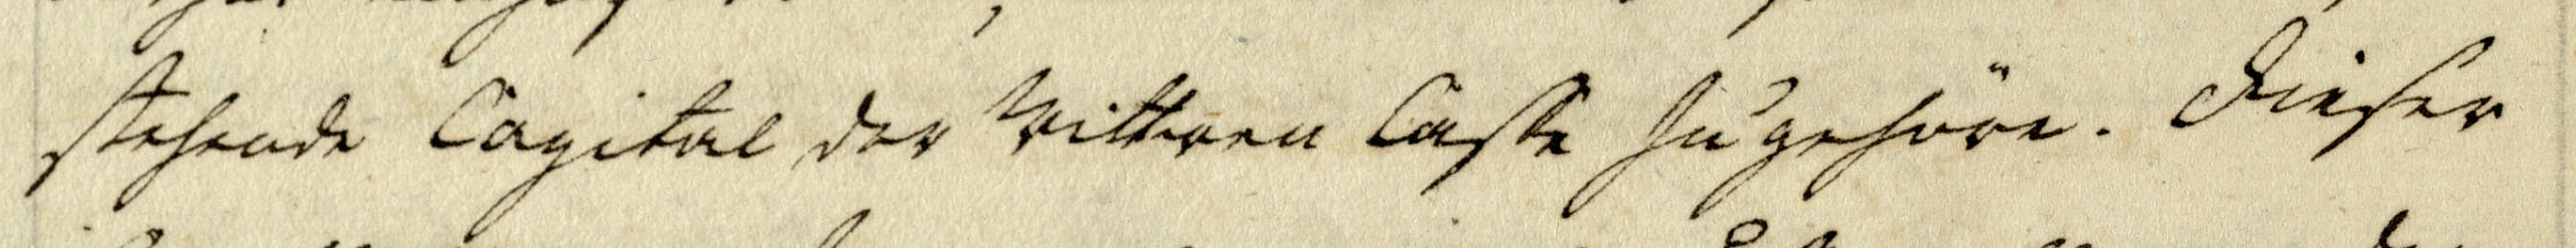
stehende Capital der Wittwen Casse zugehöre. Dieser
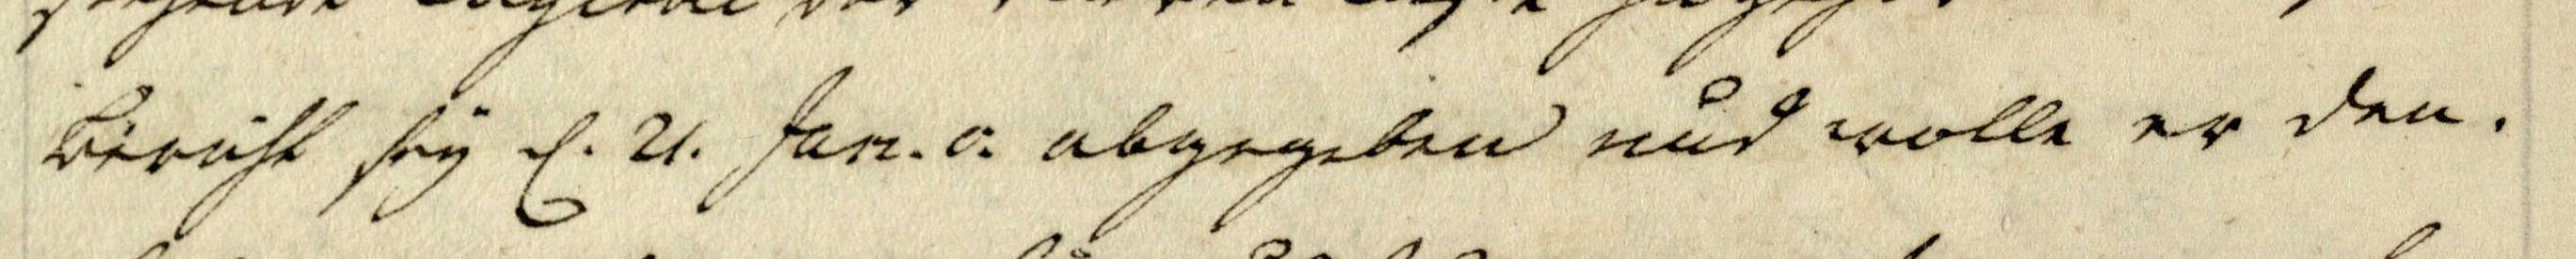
Bericht seÿ l. 21. Jan. c. abgegeben und wolle er den¬
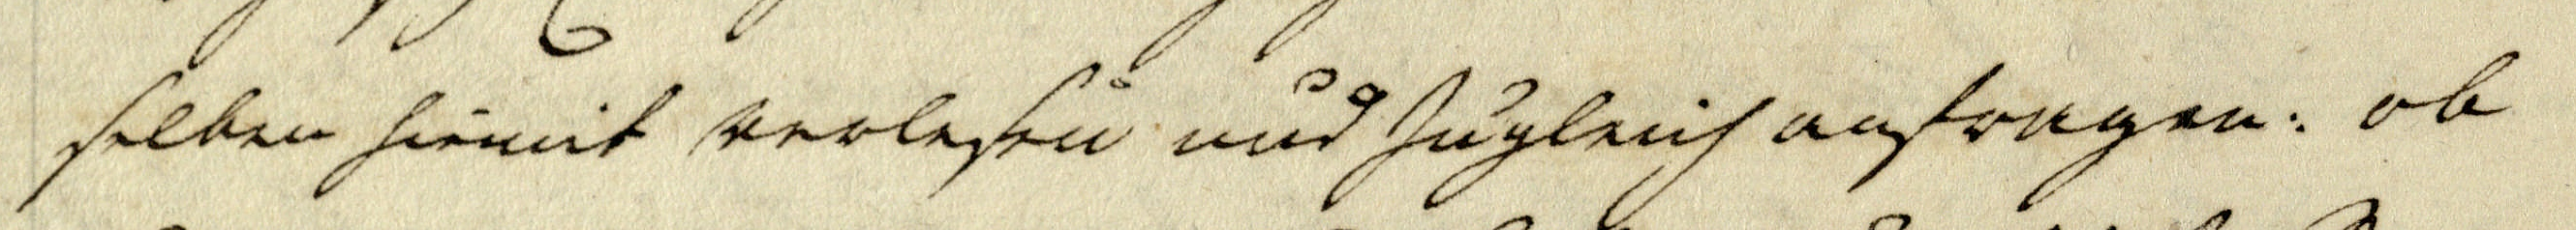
selben hiemit verlesen und zugleich anfragen: ob
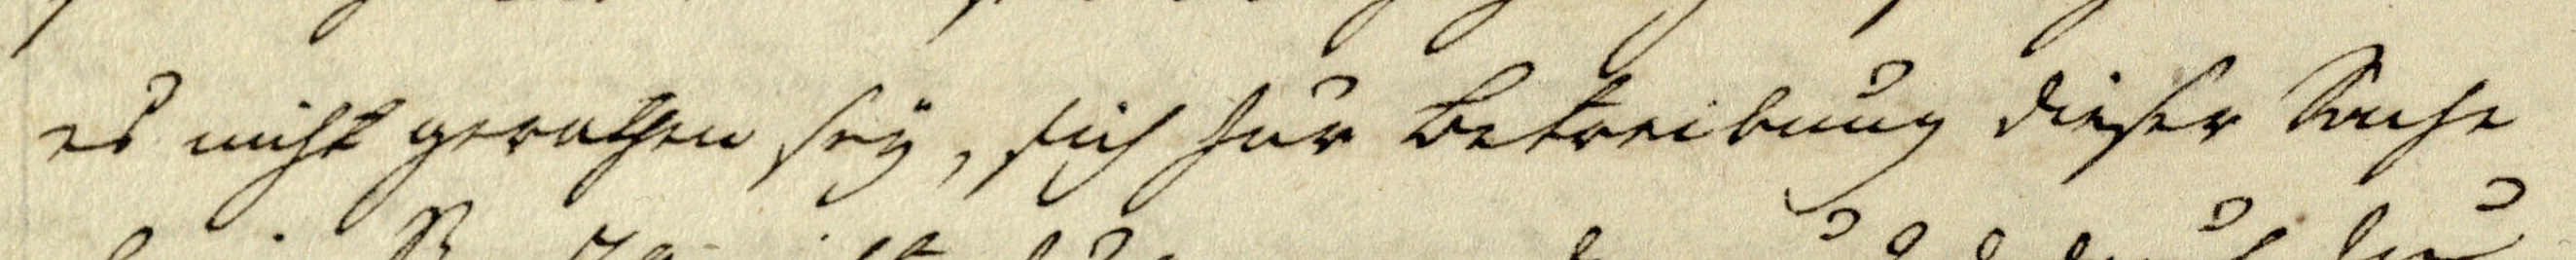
es nicht gerathen seÿ, sich zur Betreibung dieser Sache
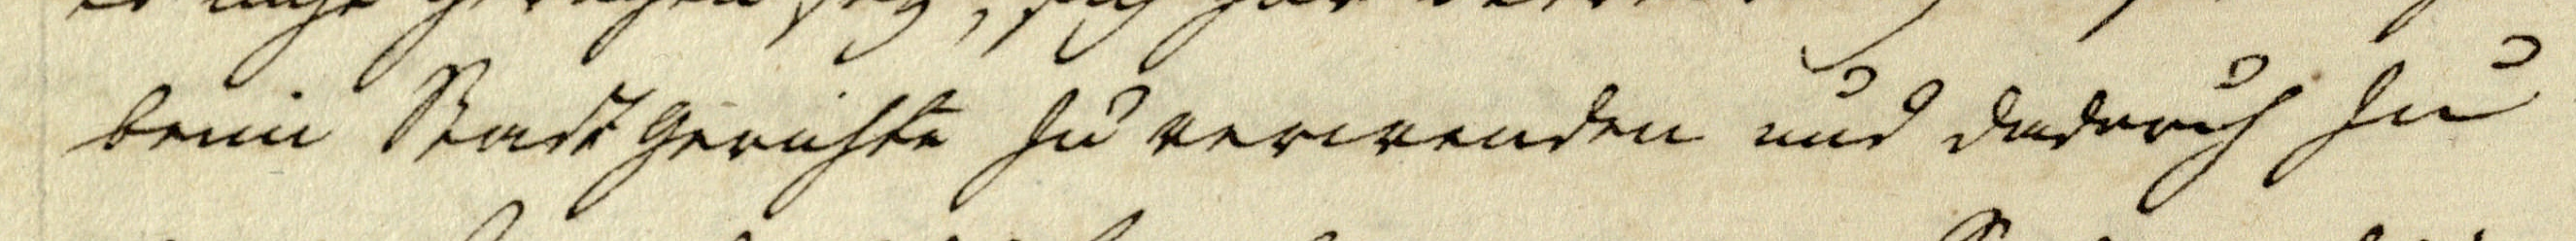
beim Stadt Gerichte zu verwenden und dadurch zu
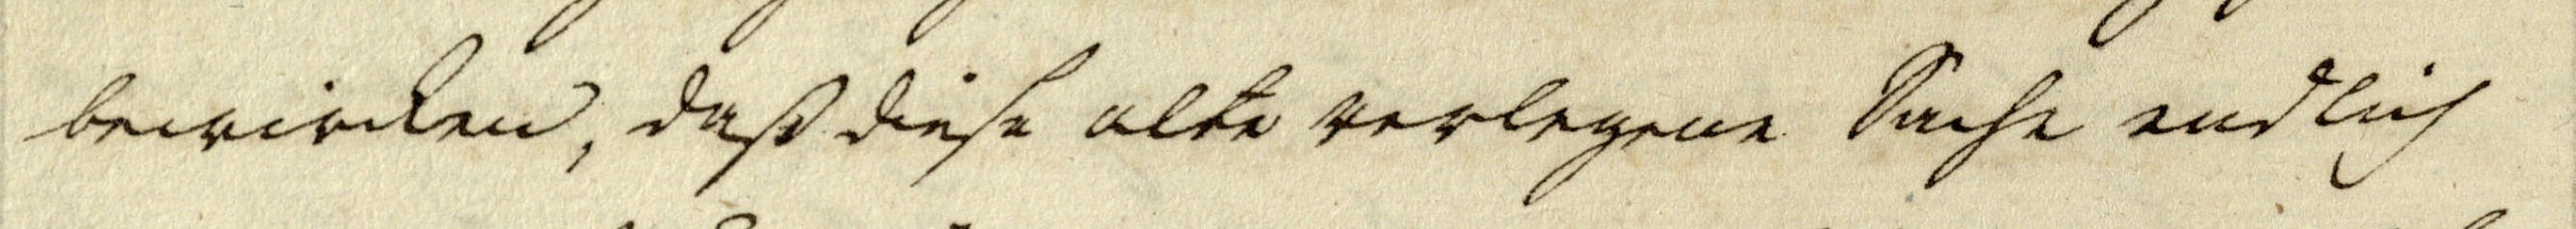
bewircken, daß diese alte verlegene Sache endlich
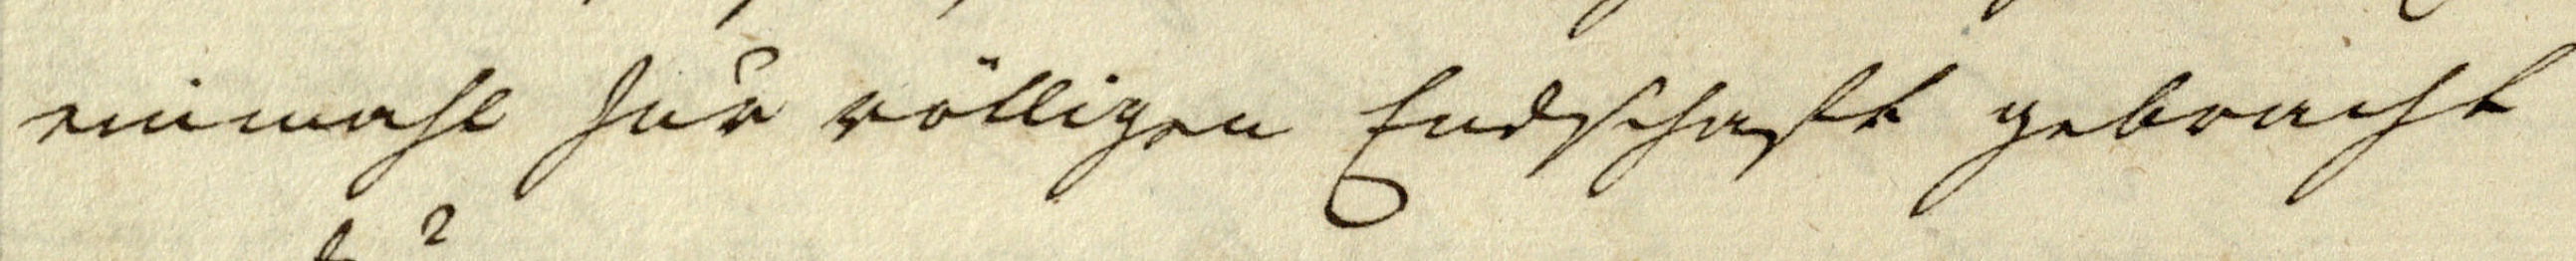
einmahl zur völligen Endschaft gebracht
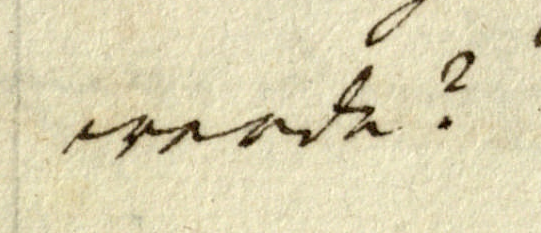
werde?
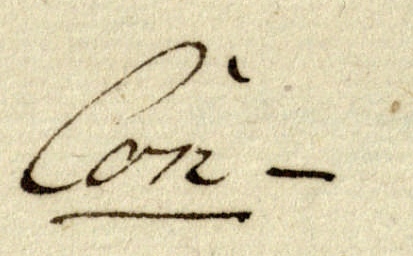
Con¬
